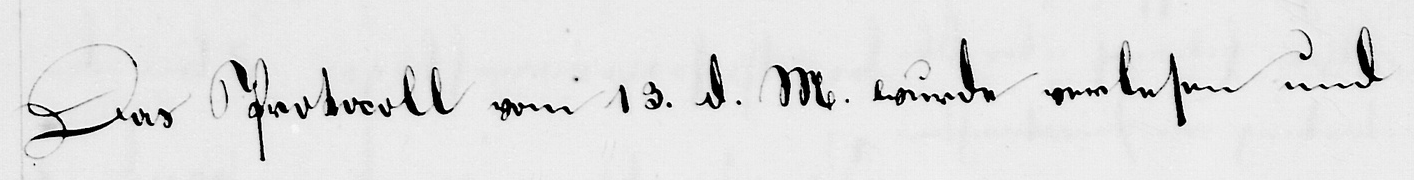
Das Protocoll vom 13. d. M. wurde verlesen und
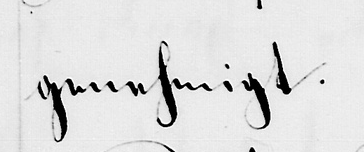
genehmigt.
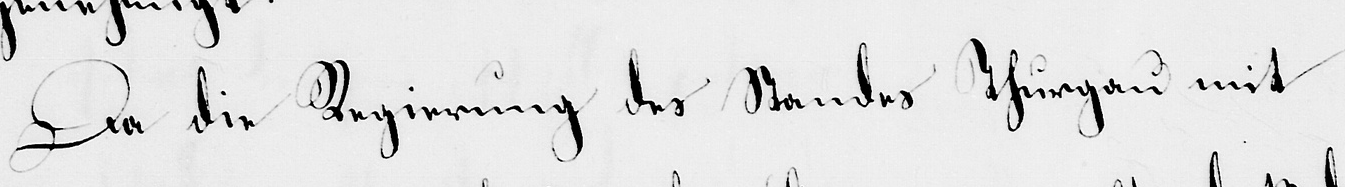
Da die Regierung des Standes Thurgau mit
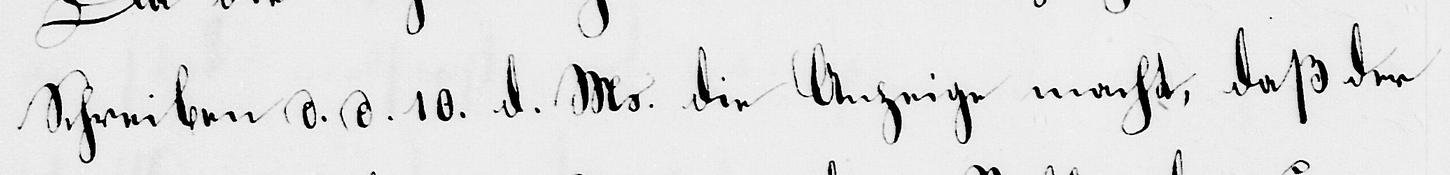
Schreiben d. d. 10. d. Ms. die Anzeige macht, daß der
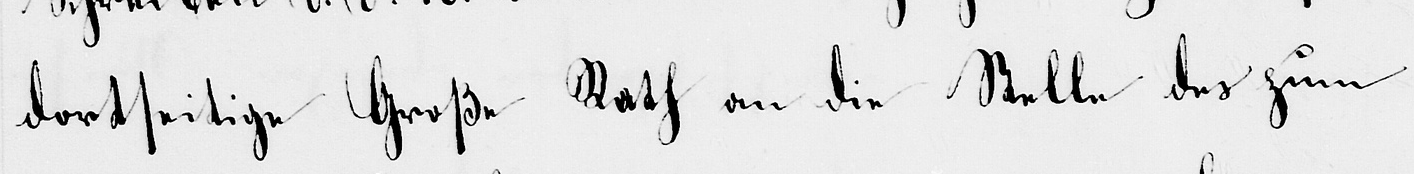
dortseitige Große Rath an die Stelle des zum
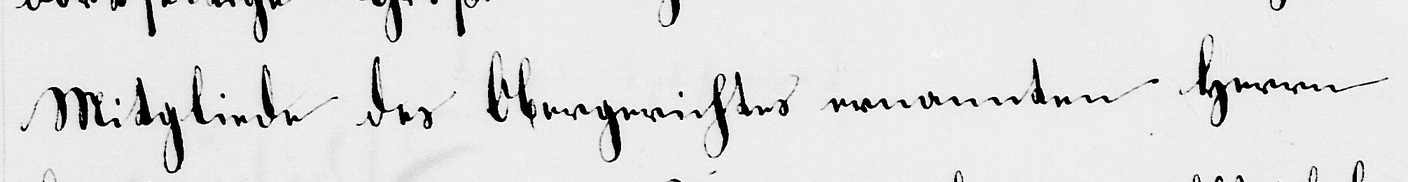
Mitgliede des Obergerichtes ernannten Herrn
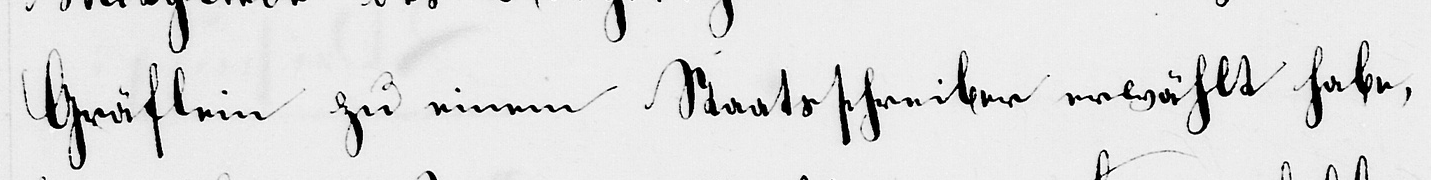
Gräflein zu einem Staatsschreiber erwählt habe,
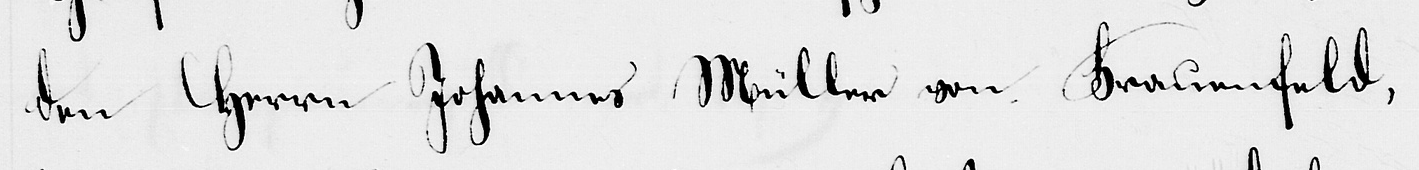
den Herrn Johannes Müller von Frauenfeld,
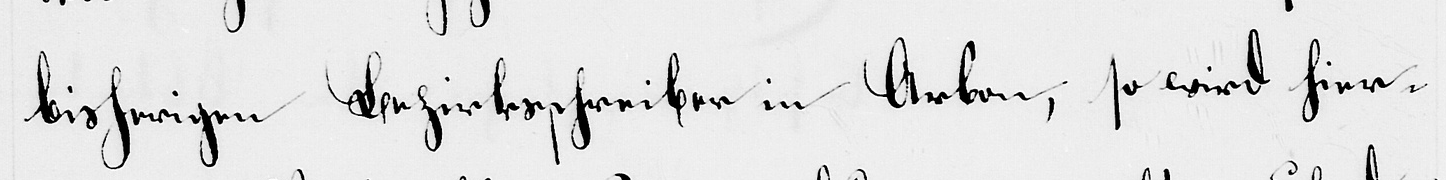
bisherigen Bezirksschreiber in Arbon, so wird hier¬
